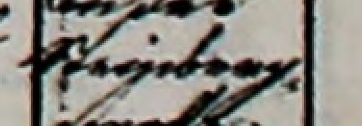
Steinberg„
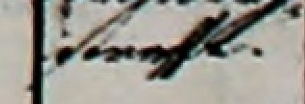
strasse
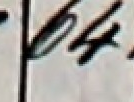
64
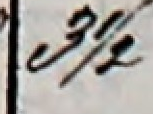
3 1/2
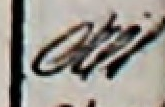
Alt
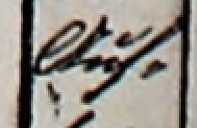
Aus„
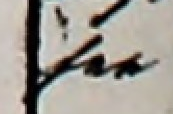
see
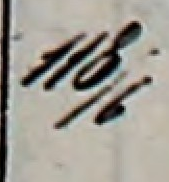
118/b
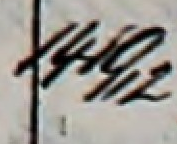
1419,2
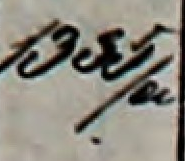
1335/a
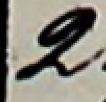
2
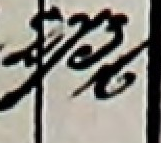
273/6
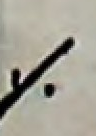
./.
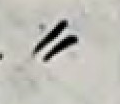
„
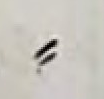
„
